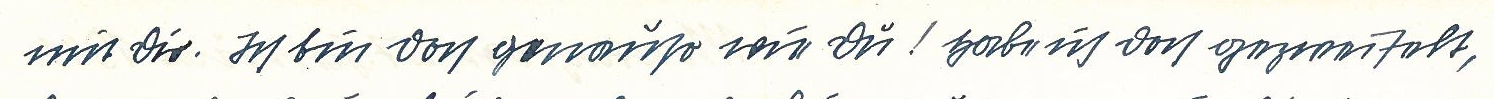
mit Dir. Ich bin doch genauso wie Du! Habe ich doch gezweifelt,
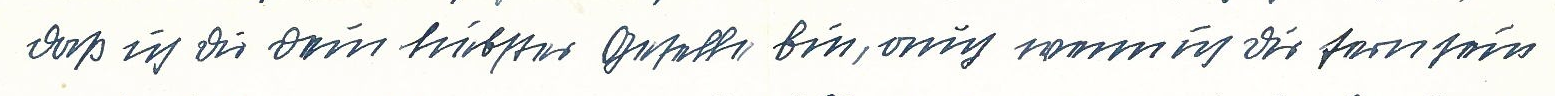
daß ich Dir Dein liebster Geselle bin, auch wenn ich Dir fern sein
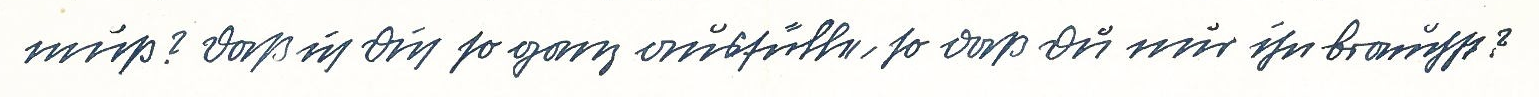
muß? Daß ich Dich so ganz ausfülle, so daß Du nur ihn brauchst?
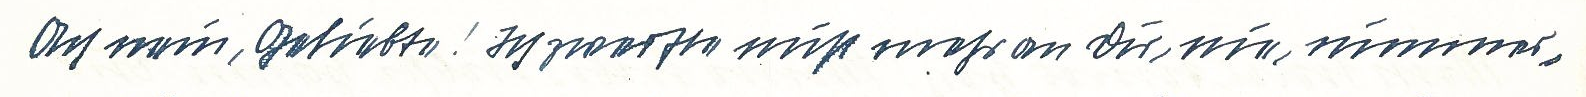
Ach nein, Geliebte! Ich zweifle nicht mehr an Dir, nie, nimmer¬
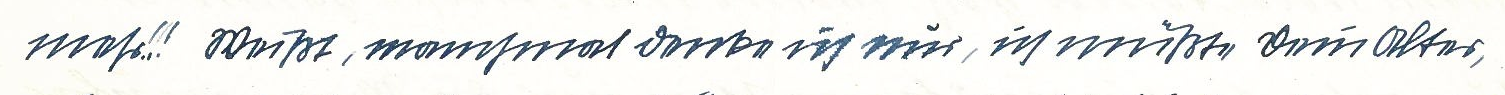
mehr!!! Weißt, manchmal denke ich mir, ich müßte Dein Alter,
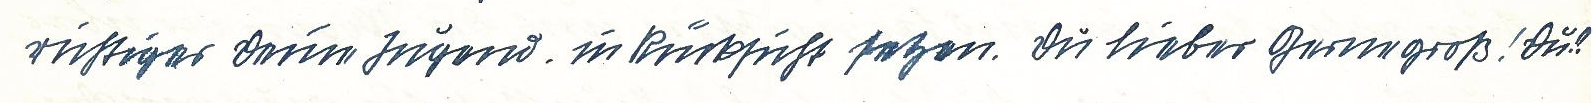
richtiger Deine Jugend, in Rücksicht setzen. Du lieber Gernegroß! Du!!
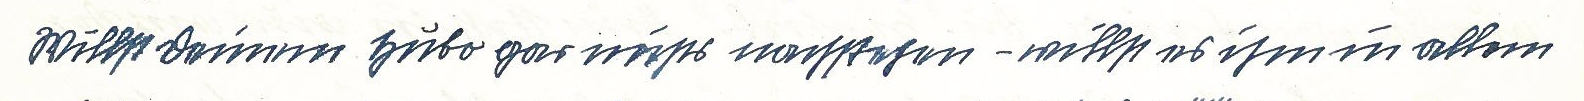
Willst Deinem Hubo gar nichts nachstehen – willst es ihm in allem
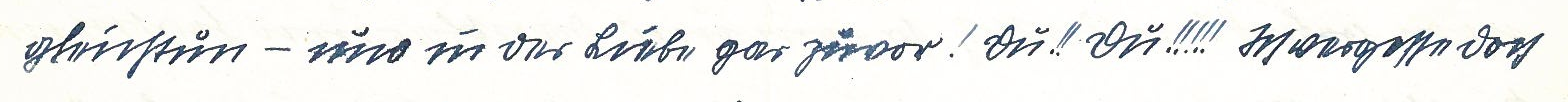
gleichtun – und in der Liebe gar zuvor! Du!! Du!!!!! Ich vergesse doch
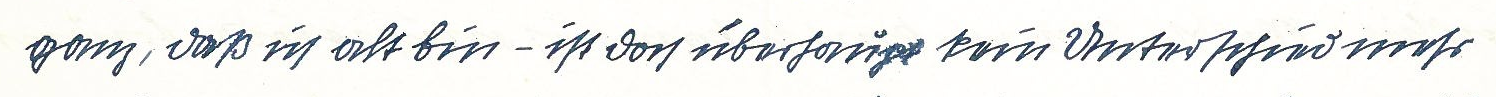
ganz, daß ich alt bin – ist doch überhaupt kein Unterschied mehr
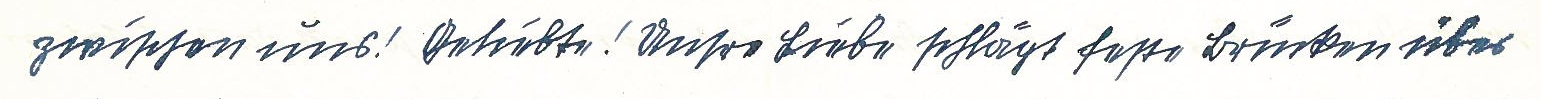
zwischen uns! Geliebte! Unsre Liebe schlägt feste Brücken über
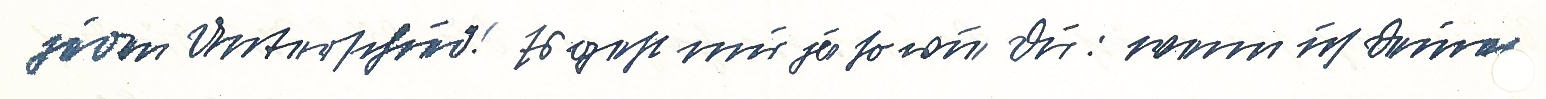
jeden Unterschied! Es geht mir ja so wie Dir: wenn ich Deine
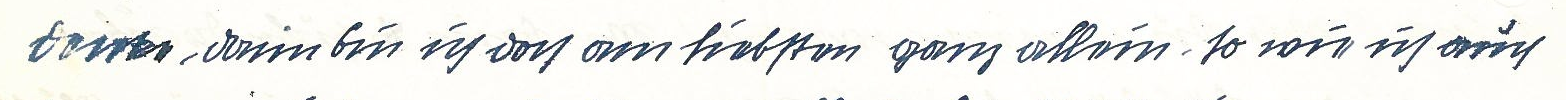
denke, dann bin ich doch am liebsten ganz allein, so wie ich auch
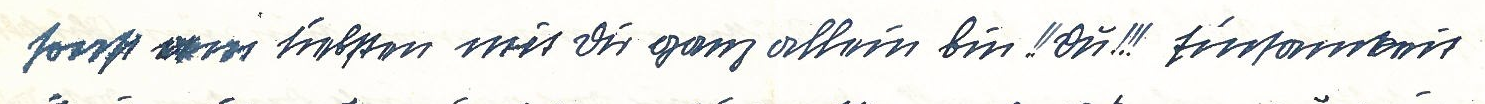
sonst a liebsten mit Dir ganz allein bin!! Du!!! Einsamkeit
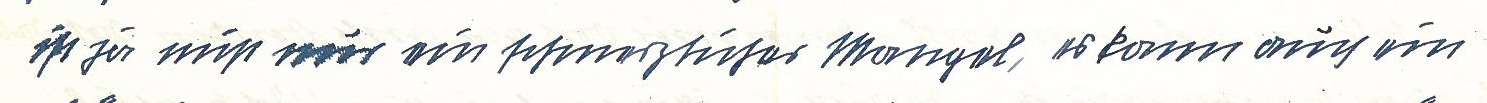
ist ja nicht nur ein schmerzlicher Mangel, es kann auch ein
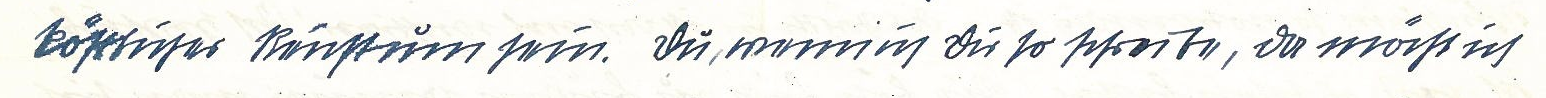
köstlicher Reichtum sein. Du, wenn ich so schreibe, da möcht ich
